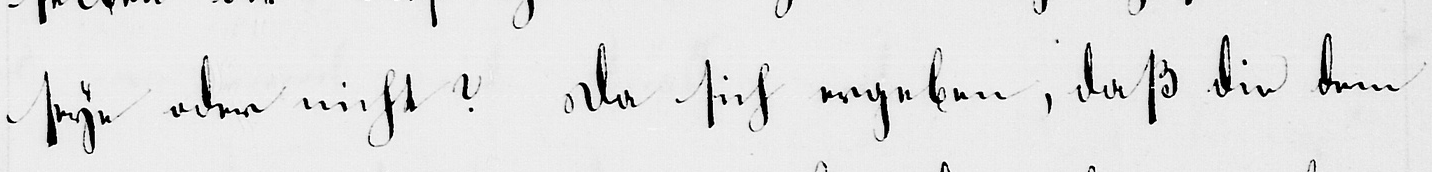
seye oder nicht? Da sich ergeben, daß die dem
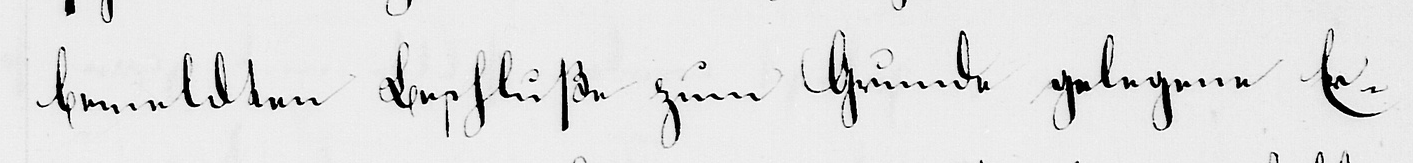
bemeldten Beschluße zum Grunde gelegene Er¬
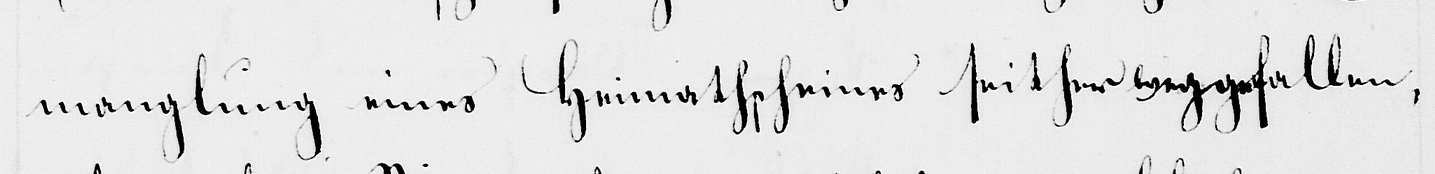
manglung eines Heimathscheines seither weggefallen,
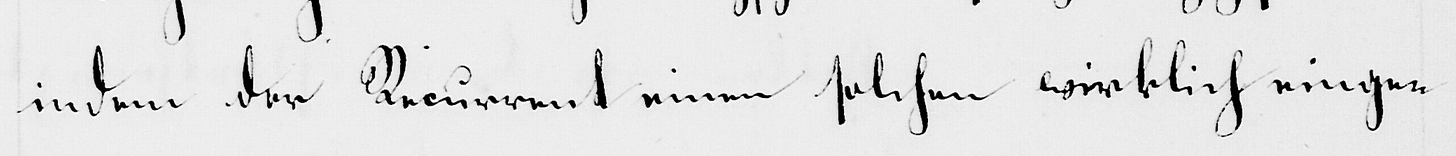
indem der Recurrent einen solchen wirklich einge¬
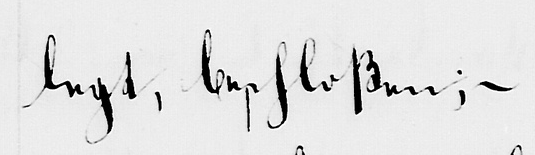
legt, beschloßen; –
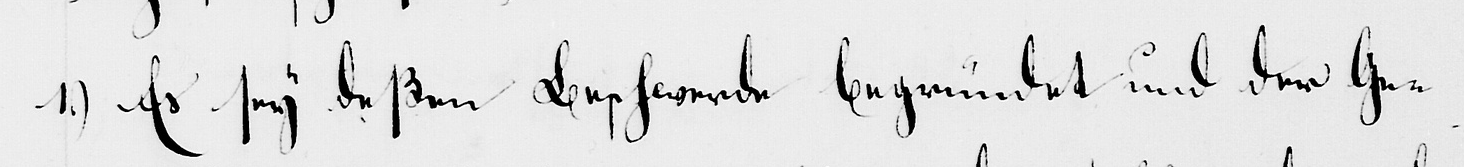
1.) Es sey deßen Beschwerde begründet und der Ge¬
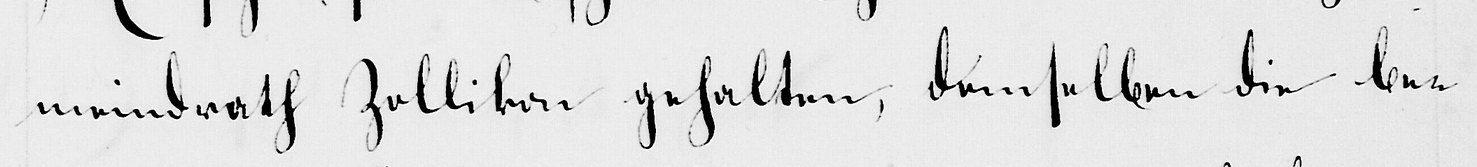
meindrath Zollikon gehalten, demselben die be¬
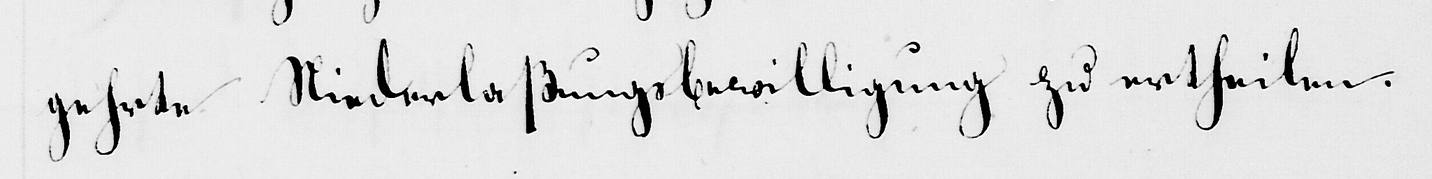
gehrte Niederlaßungsbewilligung zu ertheilen.
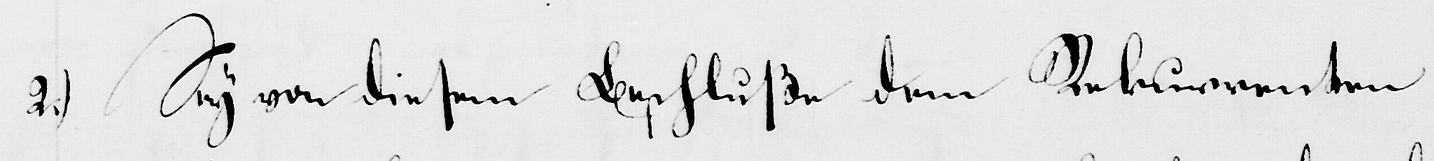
2.) Sey von diesem Beschluße dem Rekurrenten
